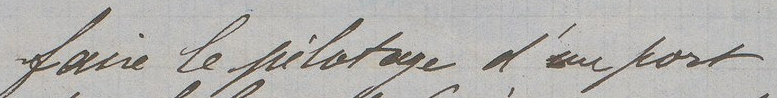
faire le pilotage d'un port
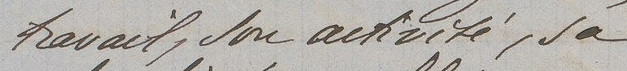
travail, son activité, sa
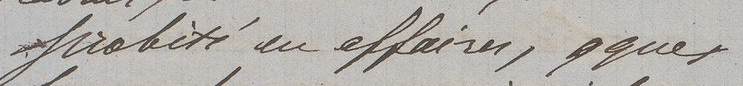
probité en affaires, qques
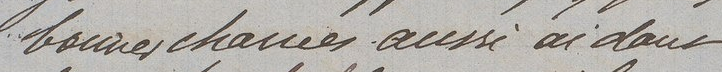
bonnes chances aussi aidant
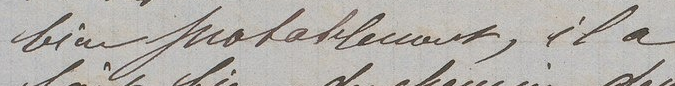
bien probablement, il a
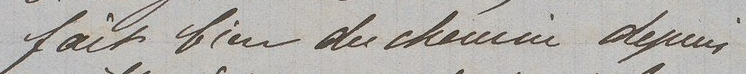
fait bien du chemin depuis
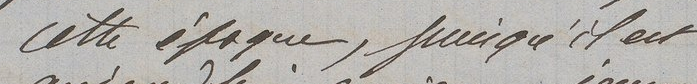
cette époque, puisqu'il est
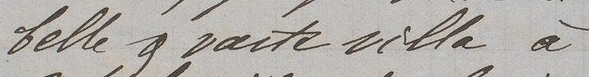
belle & vaste villa à
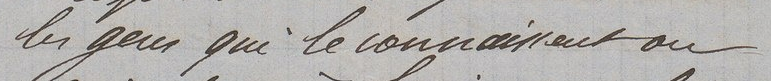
les gens qui le connaissent ou
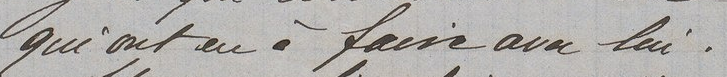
qui ont eu à faire avec lui.
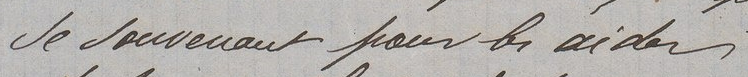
se souvenant pour les aider
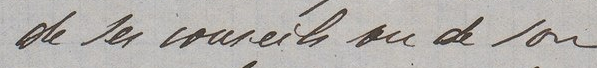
de ses conseils ou de son
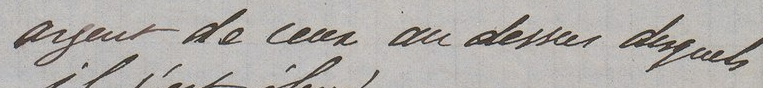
argent de ceux au dessus desquels
